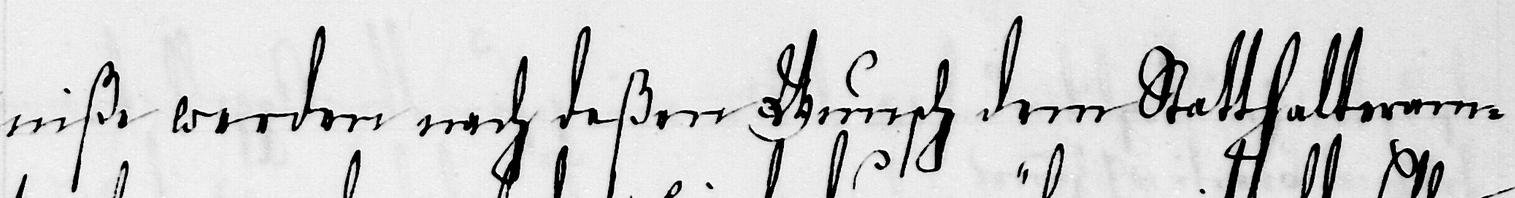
niße werden nach deßen Wunsch dem Statthalteram¬
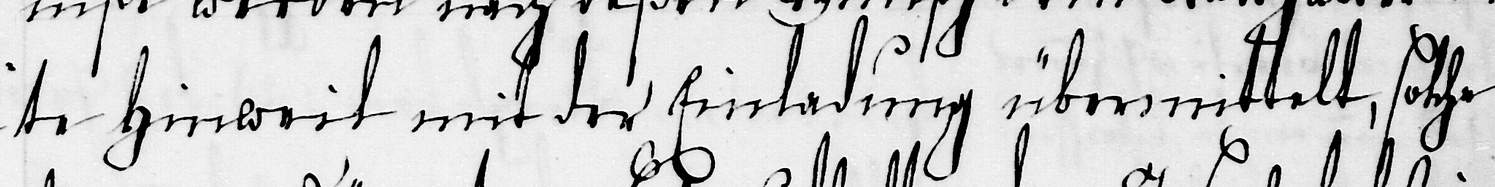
te Hinweil mit der Einladung übermittelt, solche
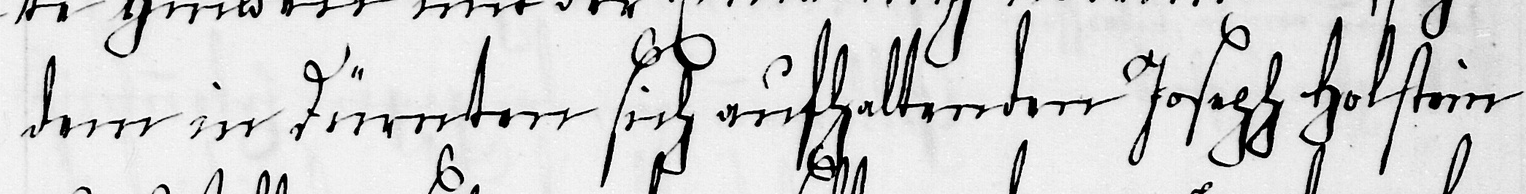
dem in Dürnten sich aufhaltenden Joseph Holstein
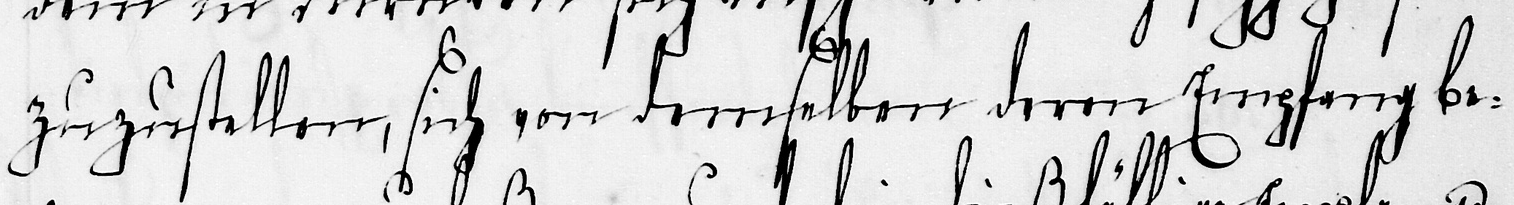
zuzustellen, sich von demselben deren Empfang be¬
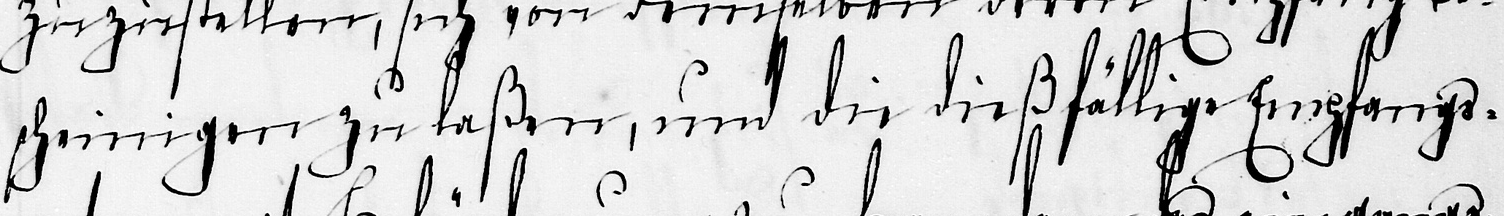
scheinigen zu laßen, und die dießfällige Empfangs¬
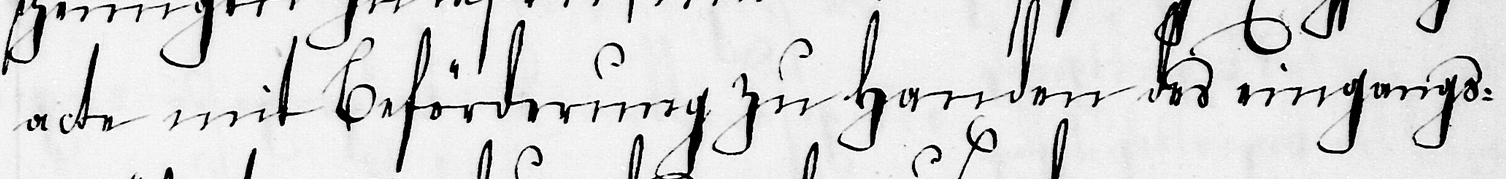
acte mit Beförderung zu Handen des eingangs¬
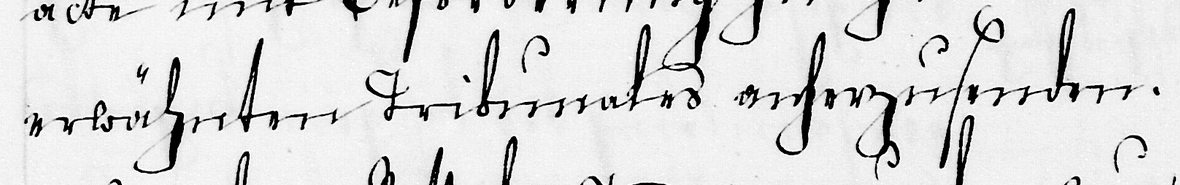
erwähnten Tribunales anherzusenden.
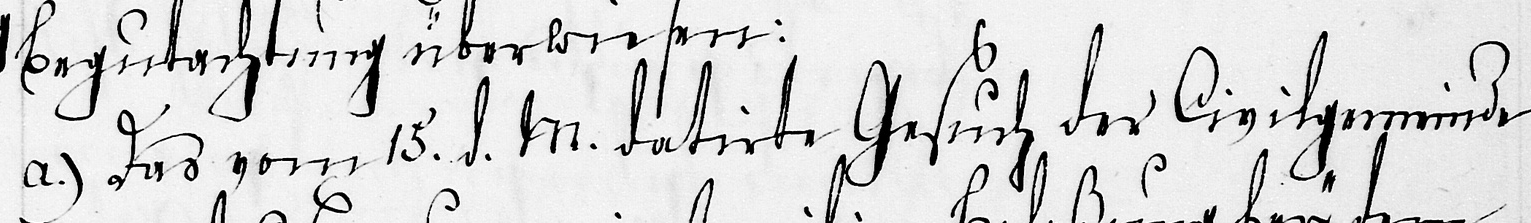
a.) Das vom 15. d. M. datirte Gesuch der Civilgemeinde
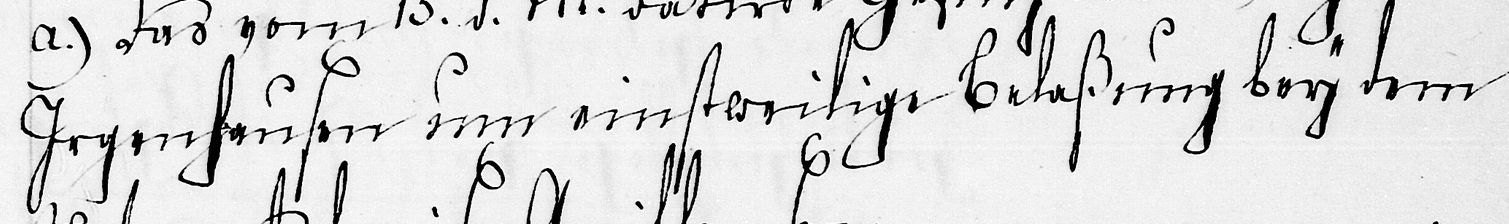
Irgenhausen um einstweilige Belaßung bey dem
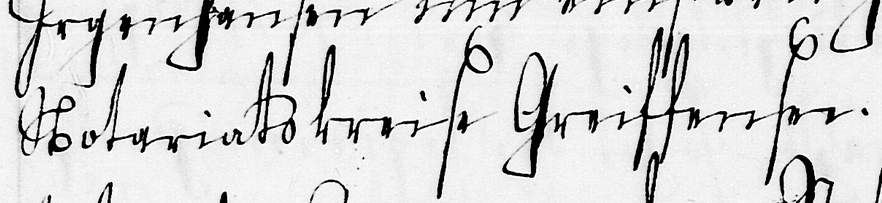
Notariatskreise Greiffense¬
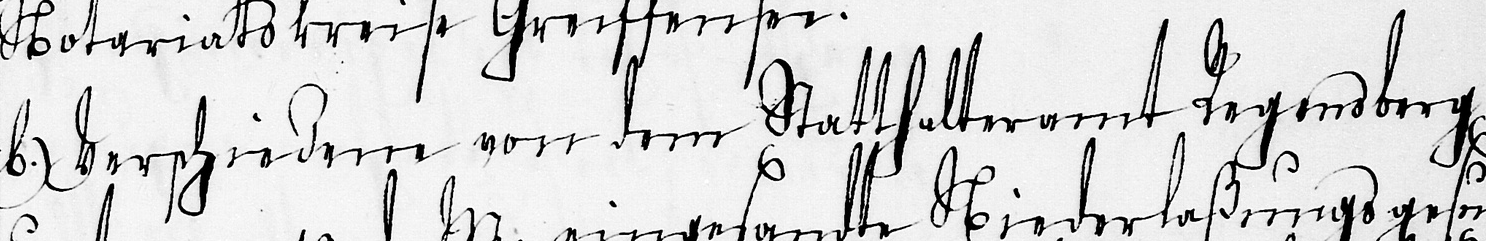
Verschiedene von dem Statthalteramt Regensberg
